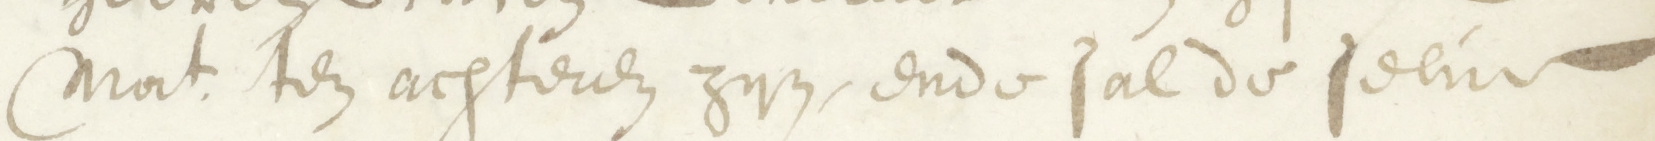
Mat. ten achteren zjn, ende sal de selue
